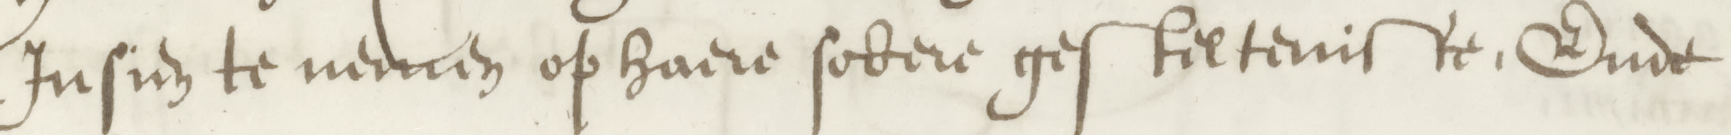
Insien te nemen op haere sobere gesteltenisse. Ende
